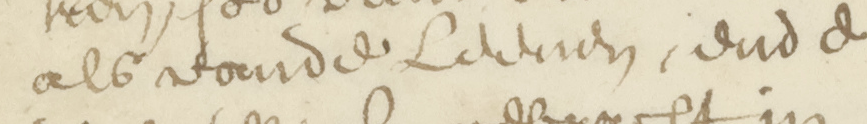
als vande Leenen, ende
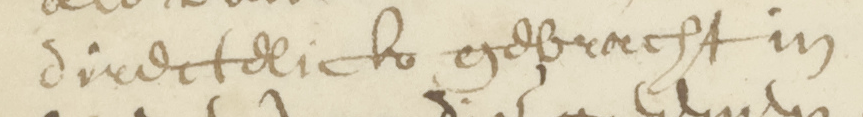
directelick gebracht in
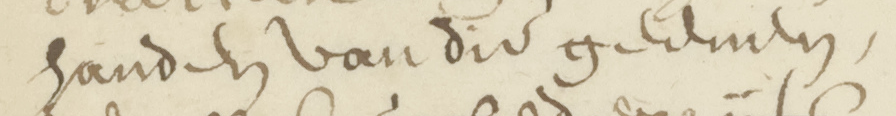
handen van die geenen,
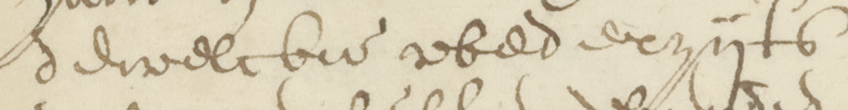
dewelcke wederzijts
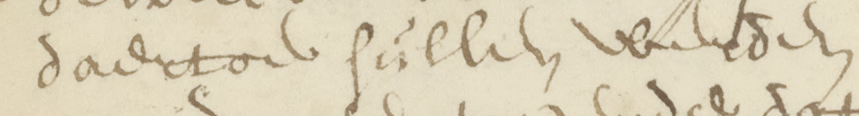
daertoe sullen werden
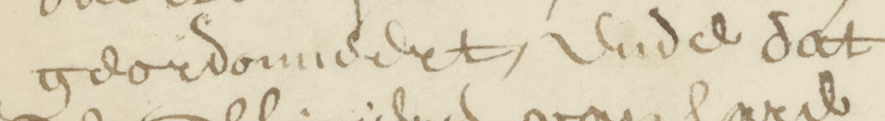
geordonneert. Ende dat
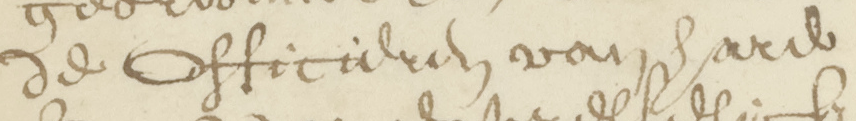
de Officieren van hare
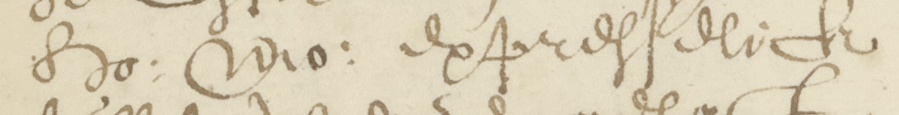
Ho:Mo: expresselick
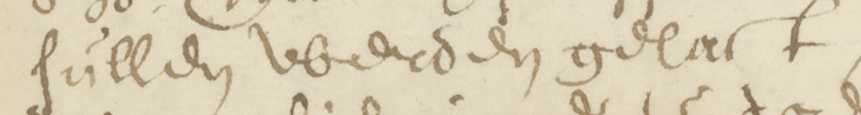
sullen werden gelast
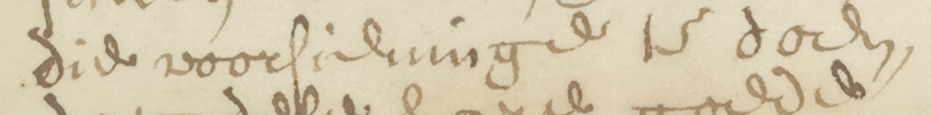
die voorsieninge te doen.
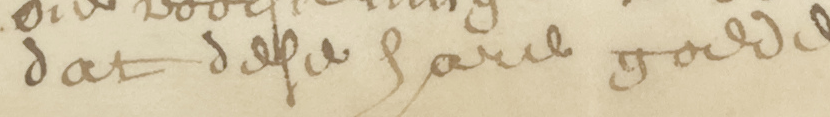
dat dese hare goede
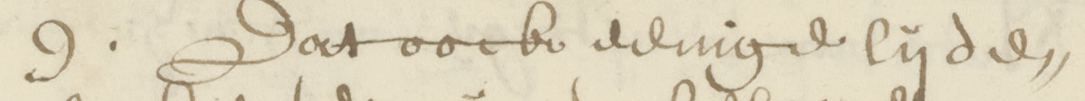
9. Dat oock eenige lijde„
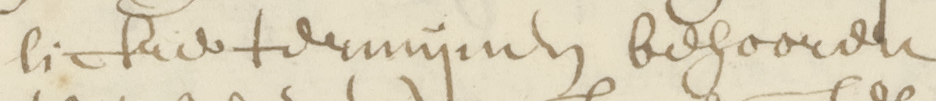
licke termijnen behooren
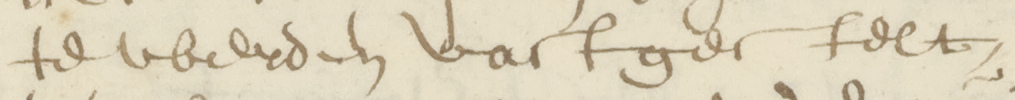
te werden vastgestelt,
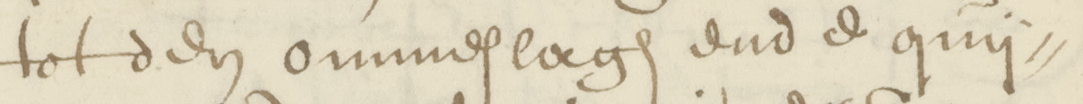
tot den ommeslagh ende quij„
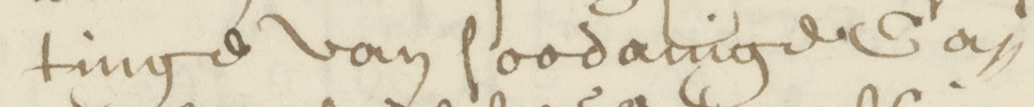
tinge van soodanige Ca„
